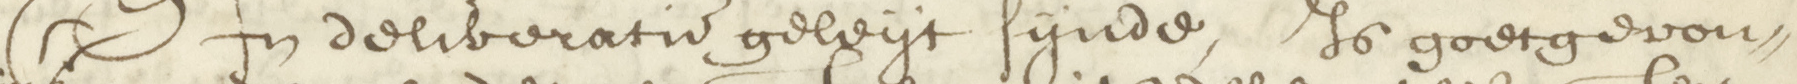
In deliberatie geleijt sijnde, Is goetgevon„
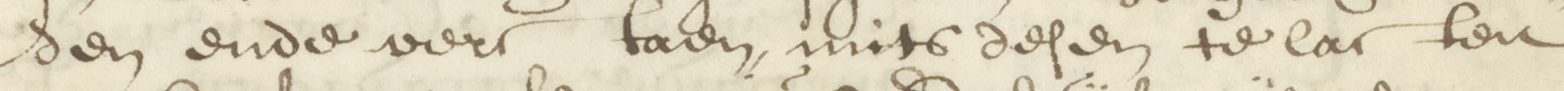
den ende verstaen, mits desen te lasten
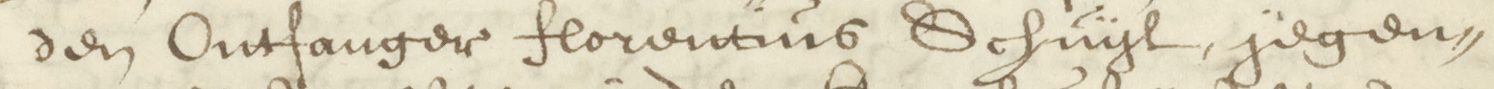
den Ontfanger Florentius Schuijl, jegen„
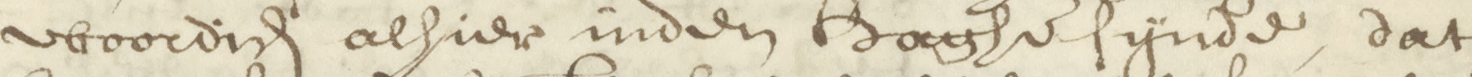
woordich alhier inden Haghe sijnde, dat
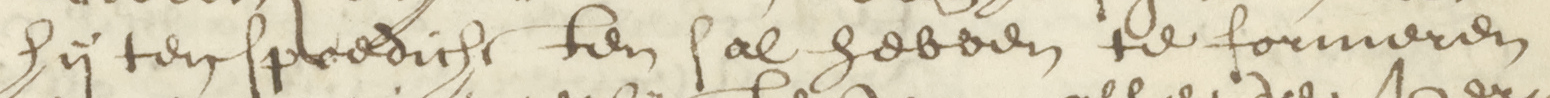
hij ten spoedichsten sal hebben te formeren
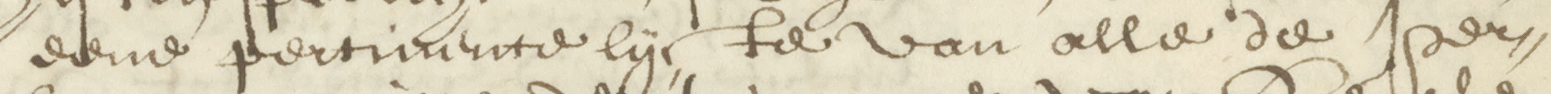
eene pertinente lijste van alle de per„
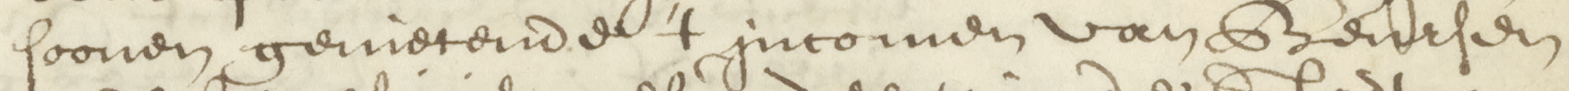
soonen genietende 't incomen van Beursen
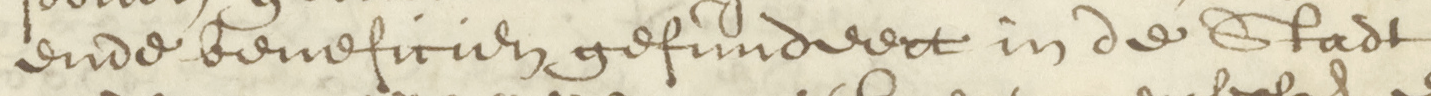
ende beneficien gefundeert in de Stadt
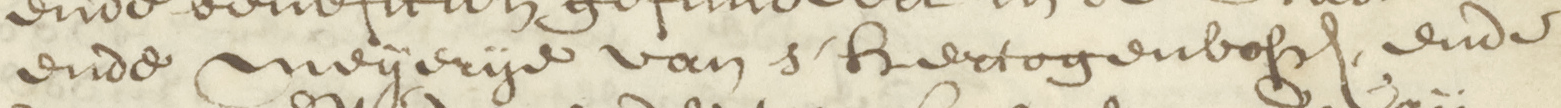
ende Meijerije van s' Hertogenbosch, ende
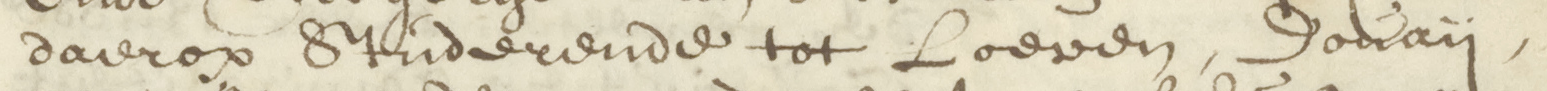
daerop Studerende tot Loeven, Douaij,
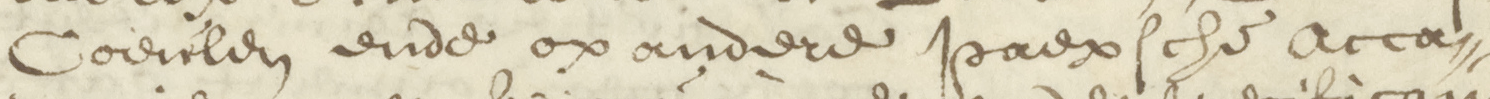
Coeulen ende op andere Paepsche Acca„
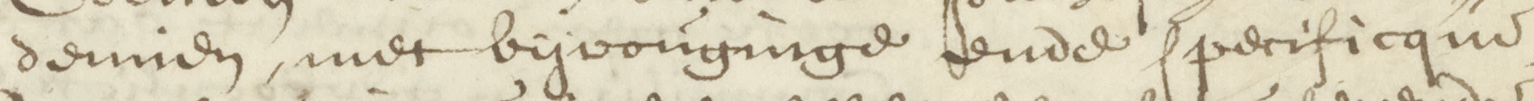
demien, met bijvouginge ende specificque
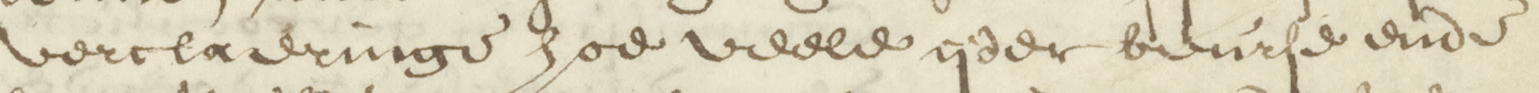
verclaeringe hoe veele ijder beurse ende
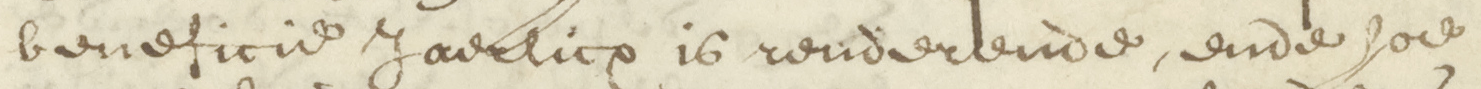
beneficie Jaerlicx is renderende, ende hoe
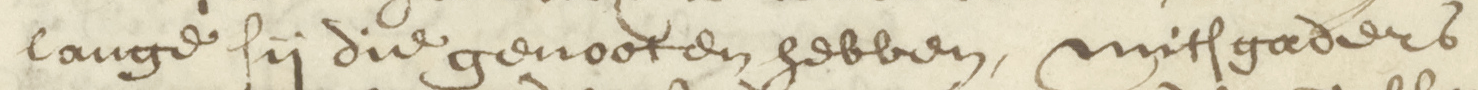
lange sij die genooten hebben, mitsgaders
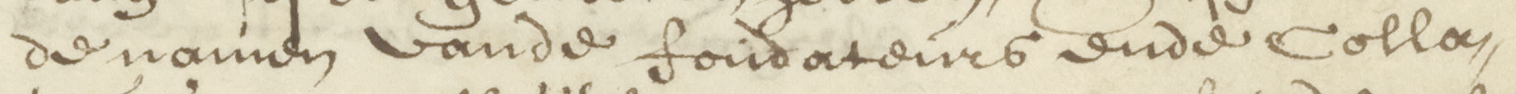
de namen vande fondateurs ende Colla„
